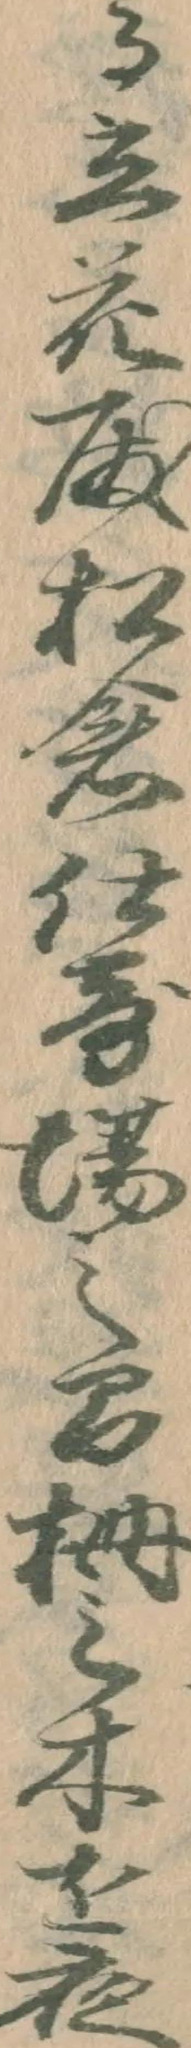る立花殿松倉仕寄場之間柵之木を夜
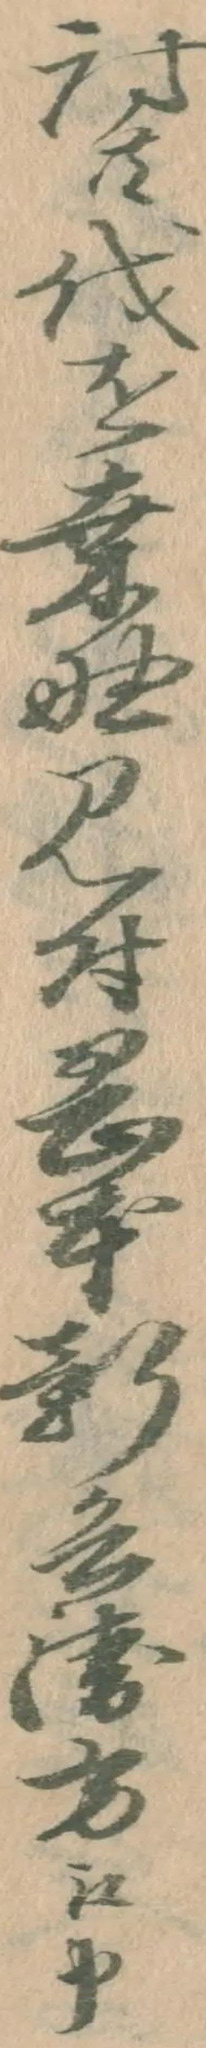討共伐を桑野見付岡本新兵衛方江申
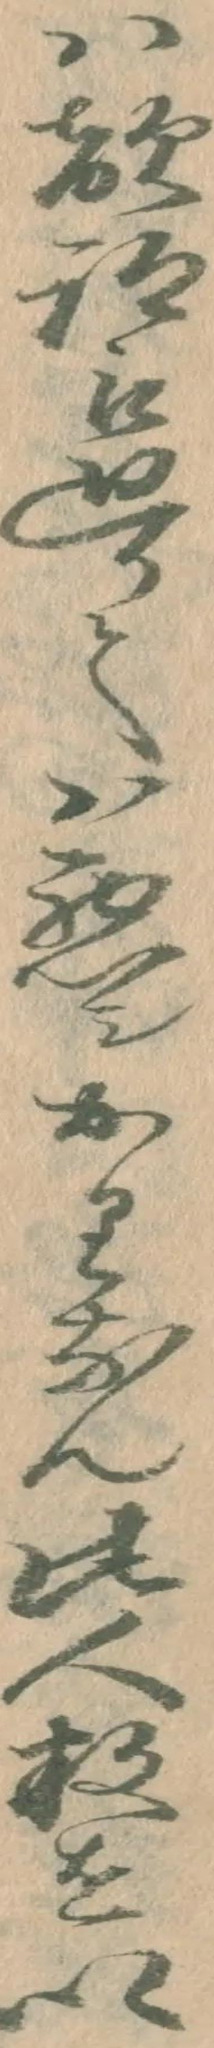は敵跡江廻りては悪しか里なん此人数を以
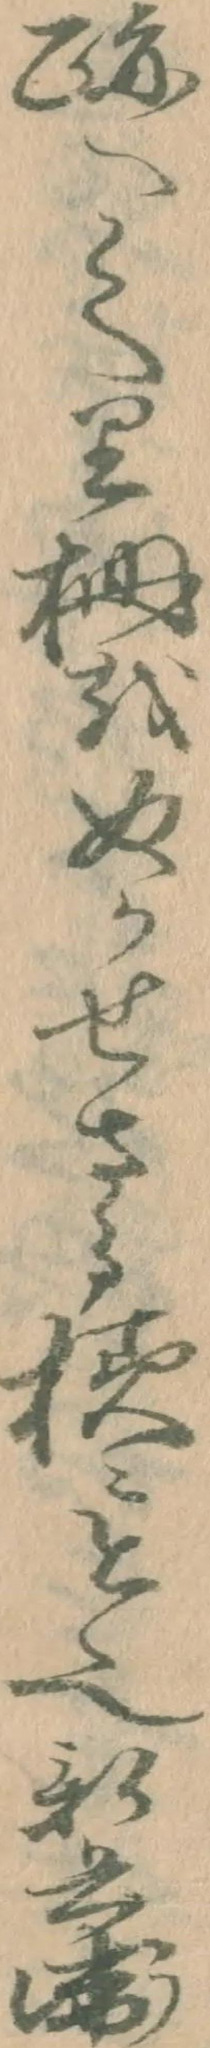跡へ〳〵里柵越ぬかせさる様にと也新兵衛

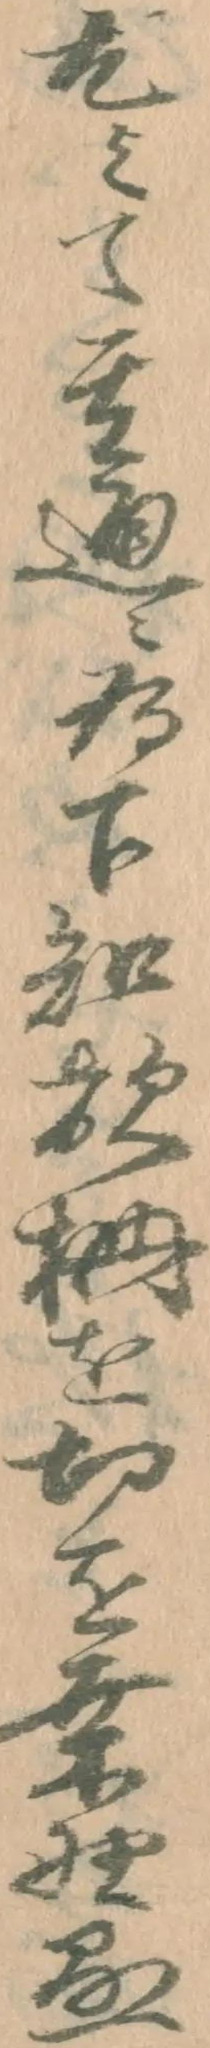尤与て其通に為下知敵柵を切進桑野懸
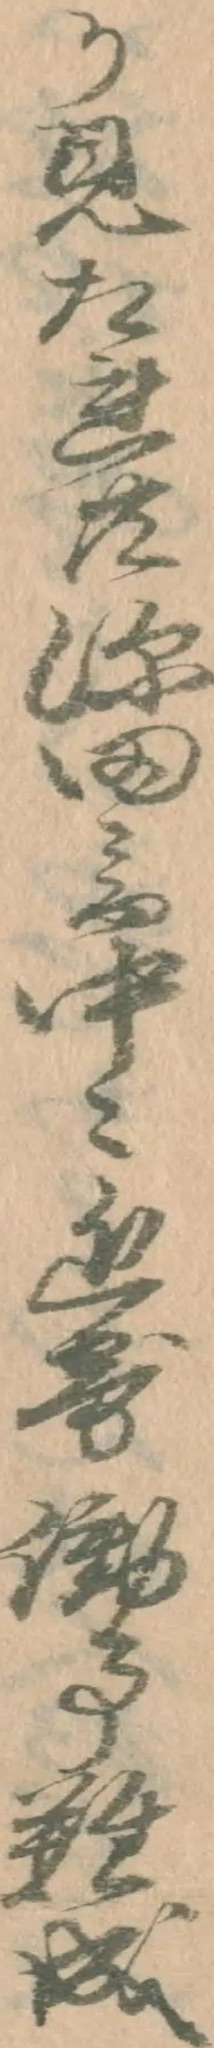り見太連共深田に而中々近寄働事難成
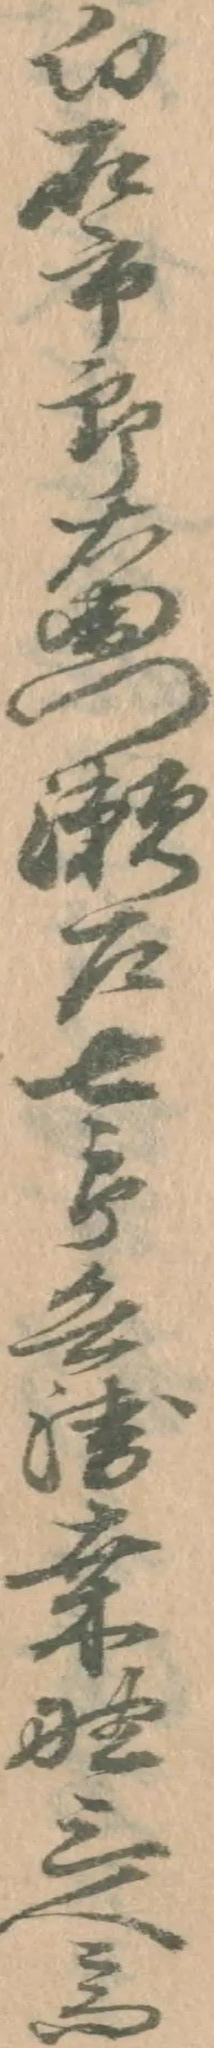白石市郎右衛門瀬左七郎兵衛桑野三人に而
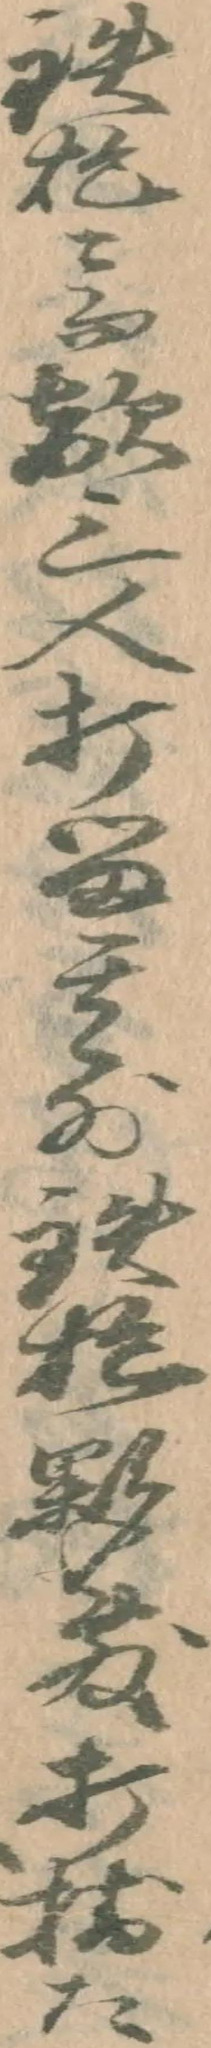鉄炮に而敵三人打留其外鉄炮夥敷打捕た
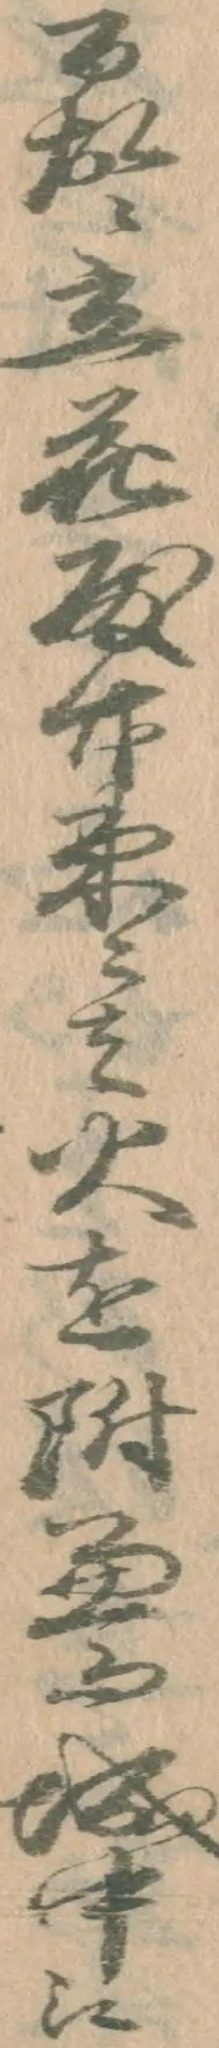る故に立花殿竹束に者火を附兼而城中江
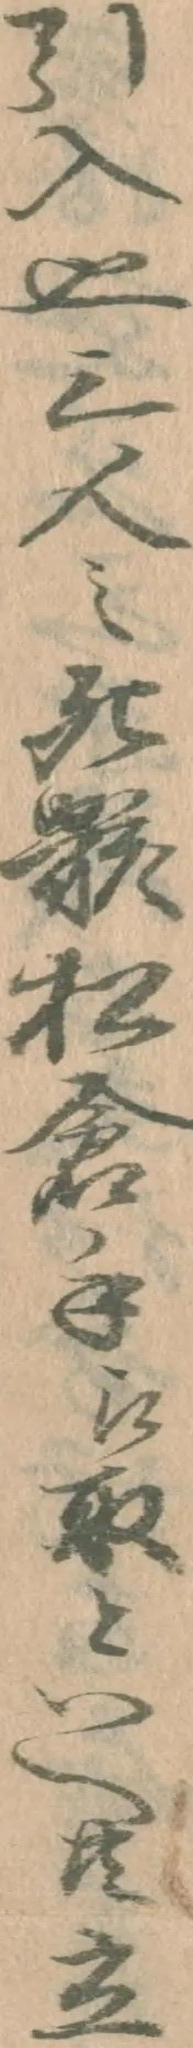引入也三人之死骸松倉手江取といへ共立
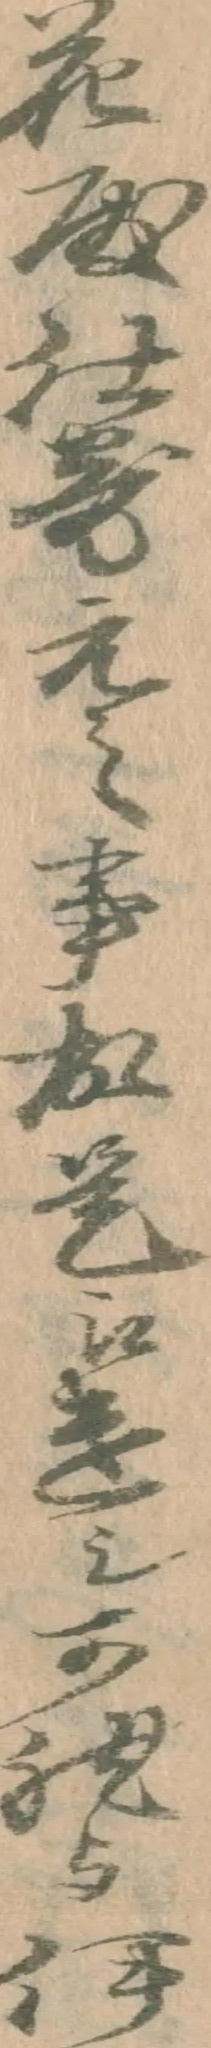花殿仕寄元之事故是江遣し可然与伊
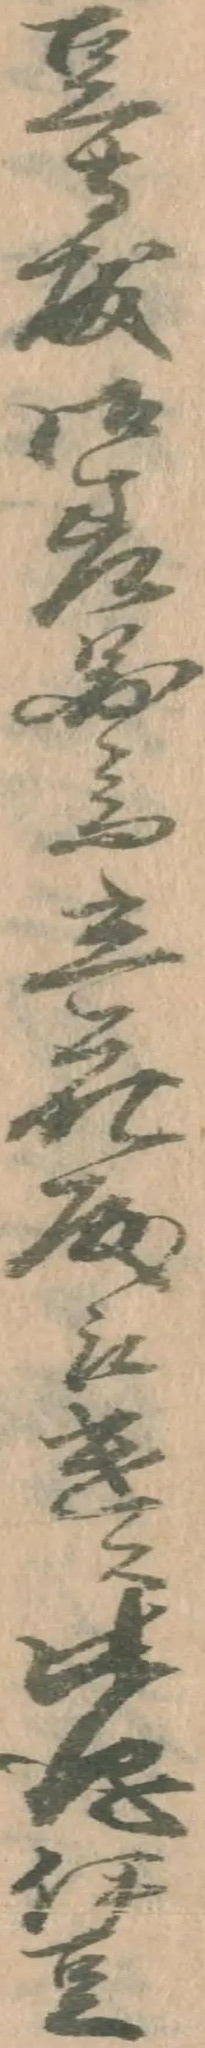豆守殿御差図に而立花殿江遣す此儀伊豆
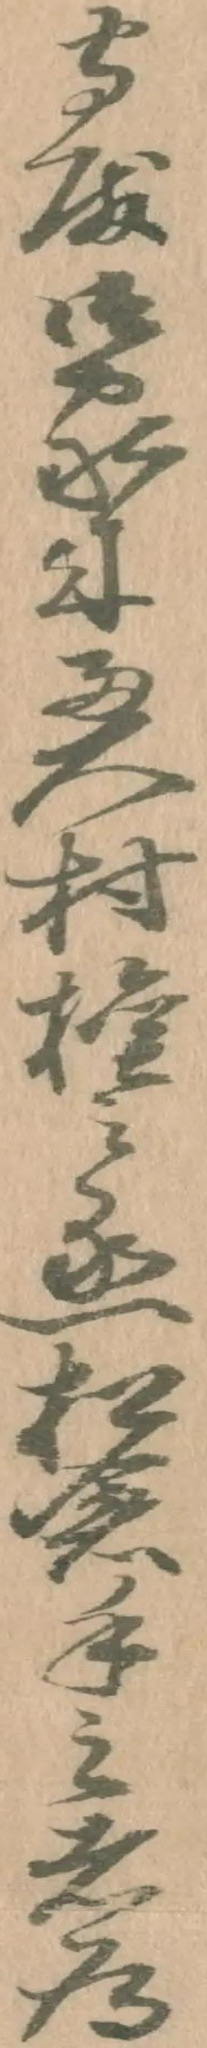守殿御家来奥村権之丞松倉手之者為
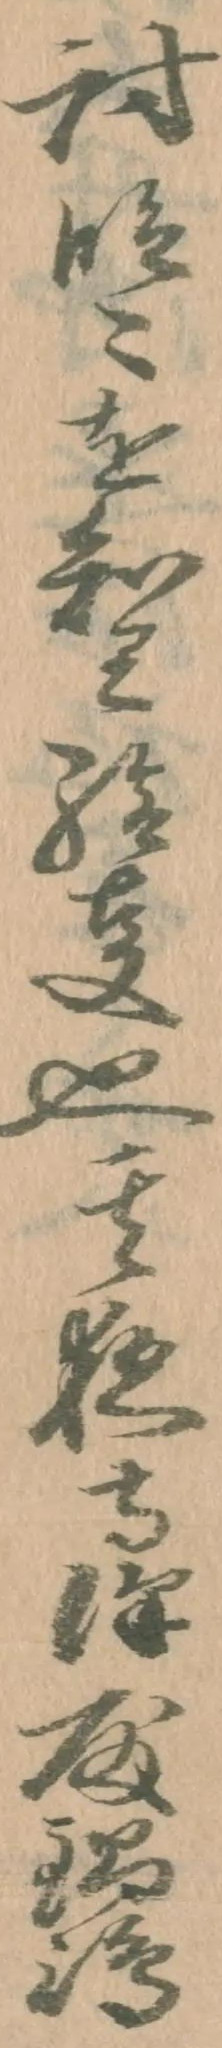討段々を知み給事也其夜寺沢殿鍋島
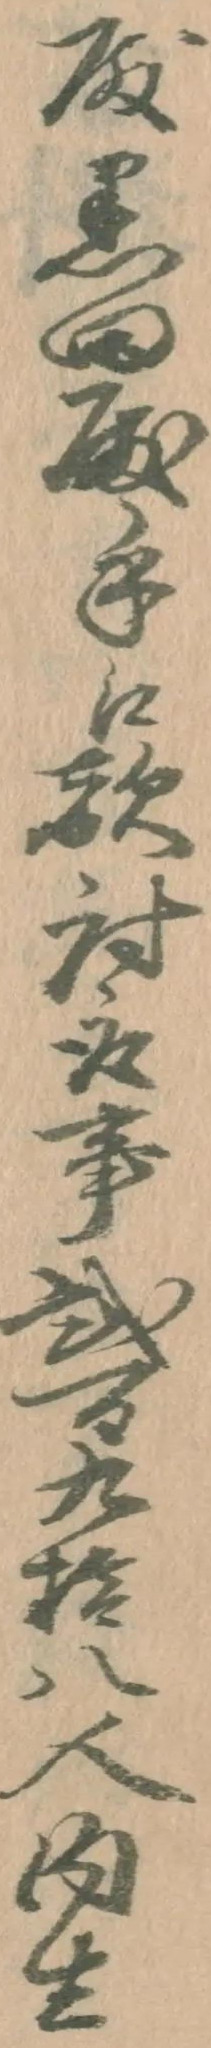殿黒田殿手江敵討取事弐万九拾八人内生
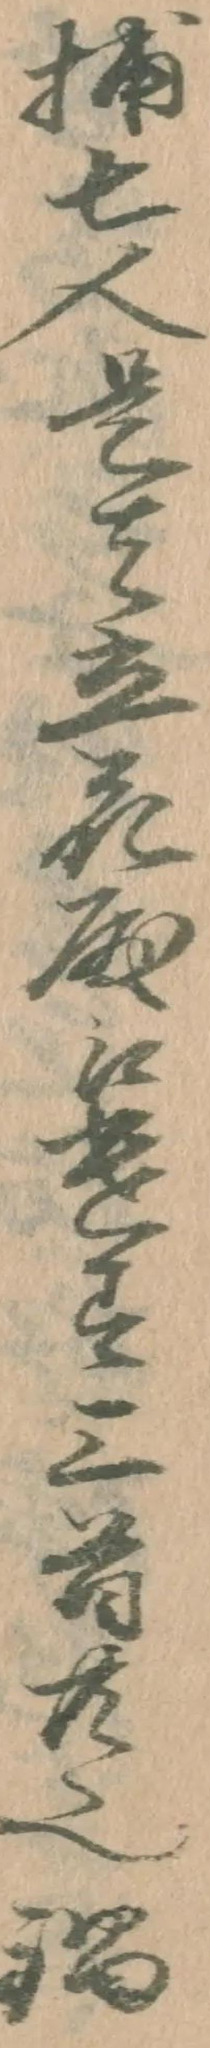捕七人是者立花殿江遣春三首共也鍋
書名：切支丹御退治記 49巻. [7]
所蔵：国立国会図書館 National Diet Library, JAPAN
